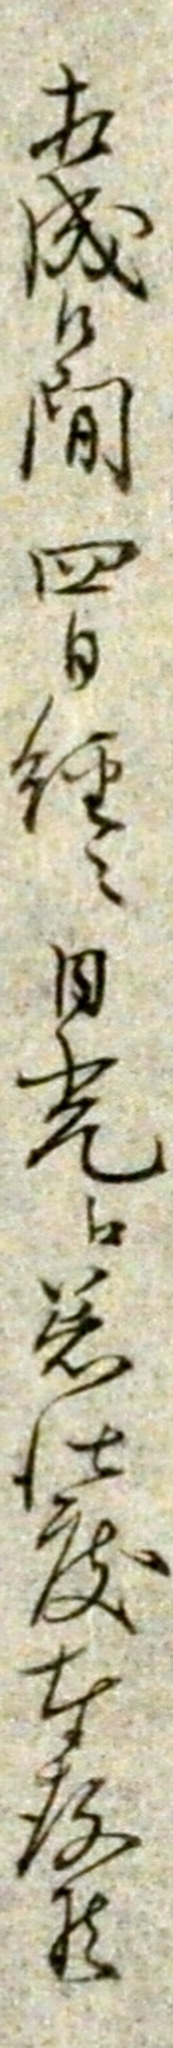相成候間四日経ニ日光江着仕度奉存候
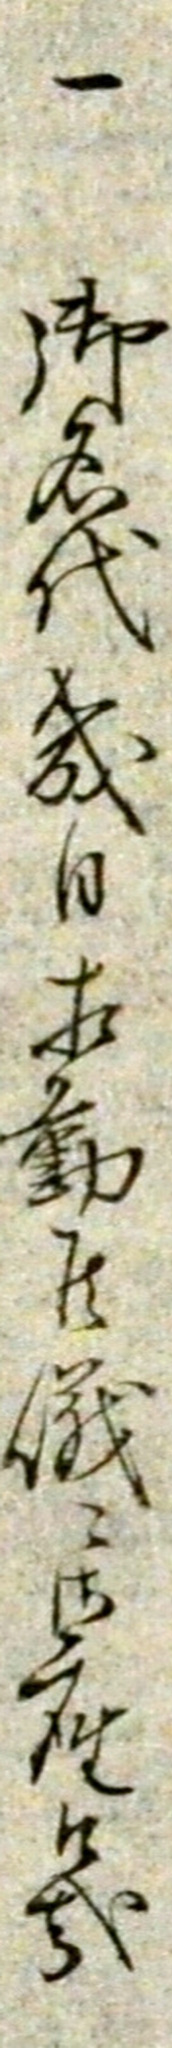一御名代幾日相勤候儀ニ御座候哉
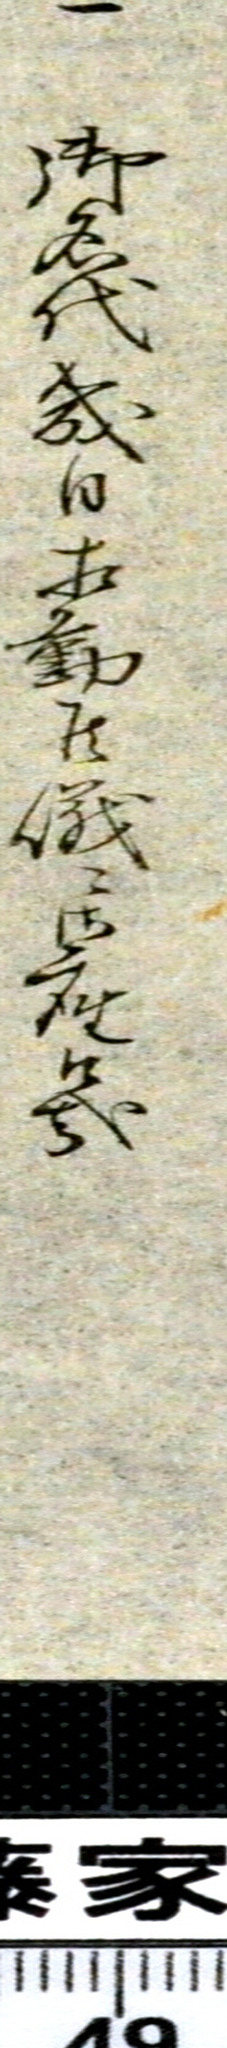一御名代幾日相勤候儀ニ御座候哉
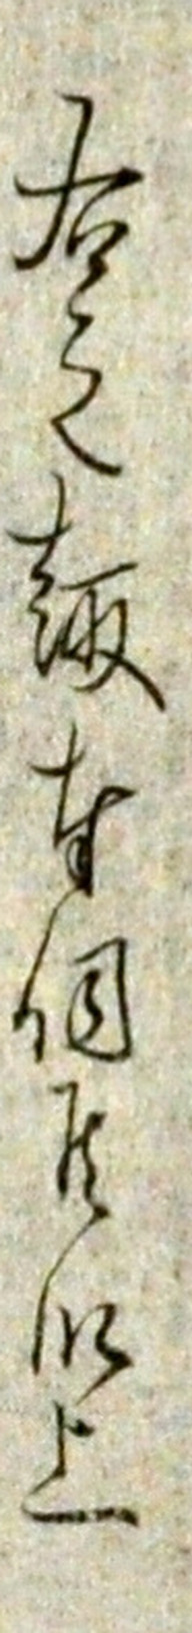右之趣奉伺候以上
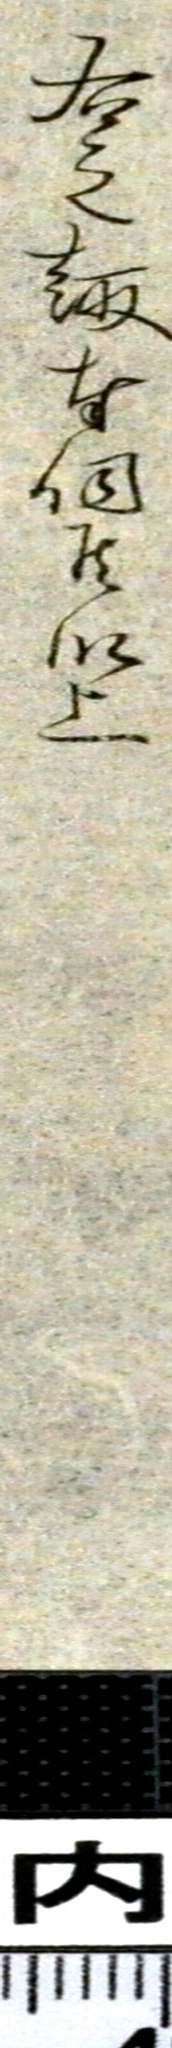右之趣奉伺候以上
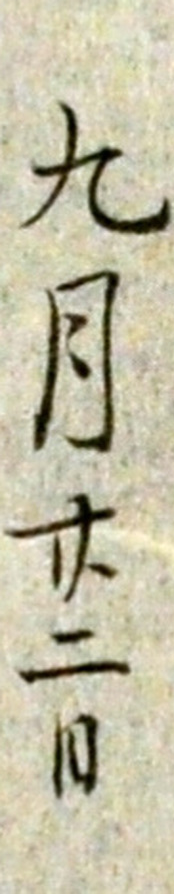九月廿二日
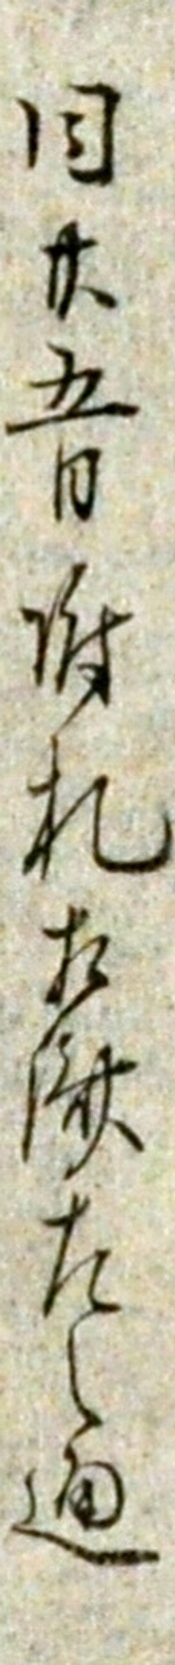同廿五日附札相済左之通
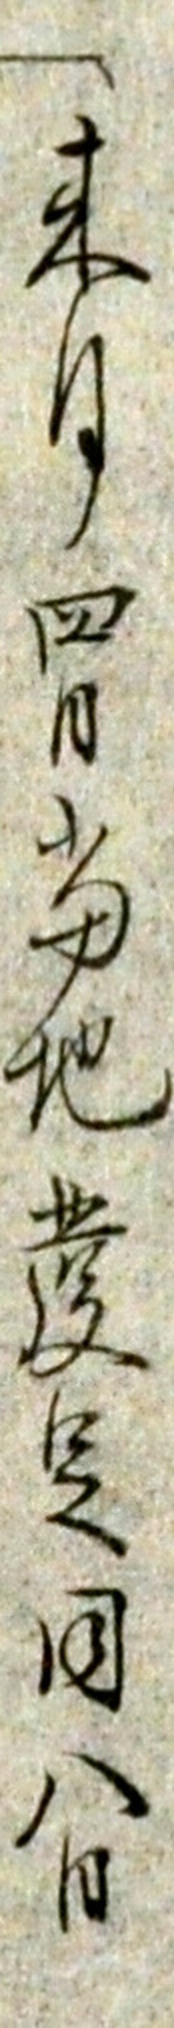来月四日当地発足同八日
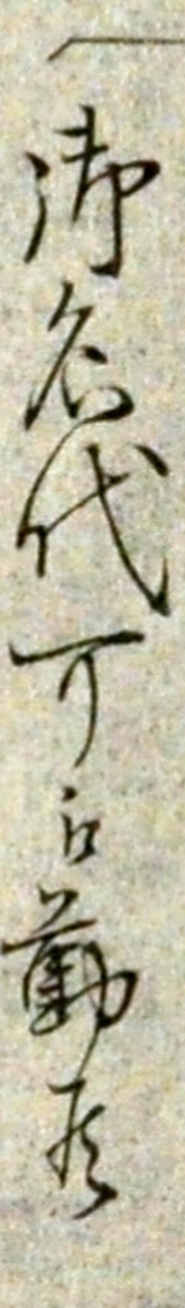御名代可被勤候
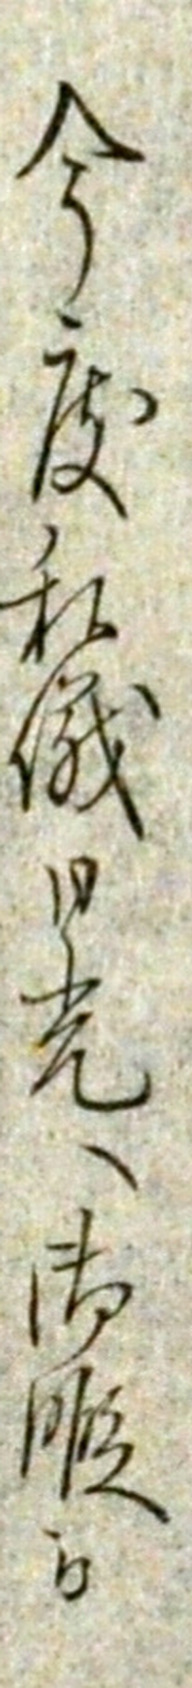今度私儀日光へ御暇被
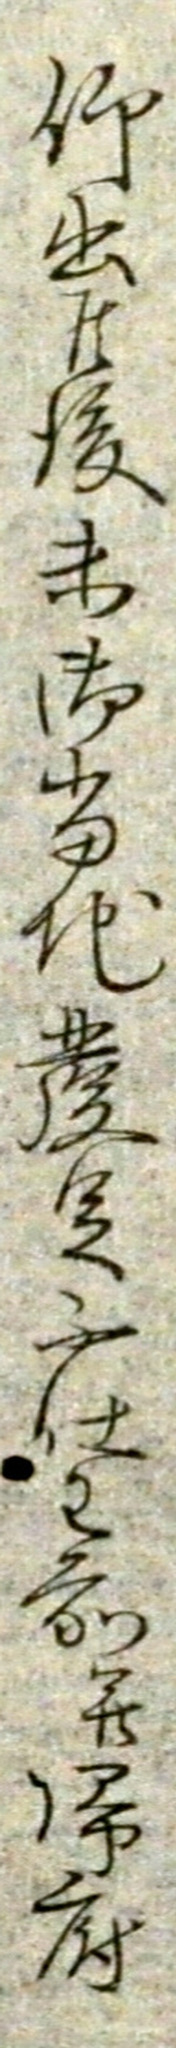仰出候後未御当地発足不仕已前幷帰府
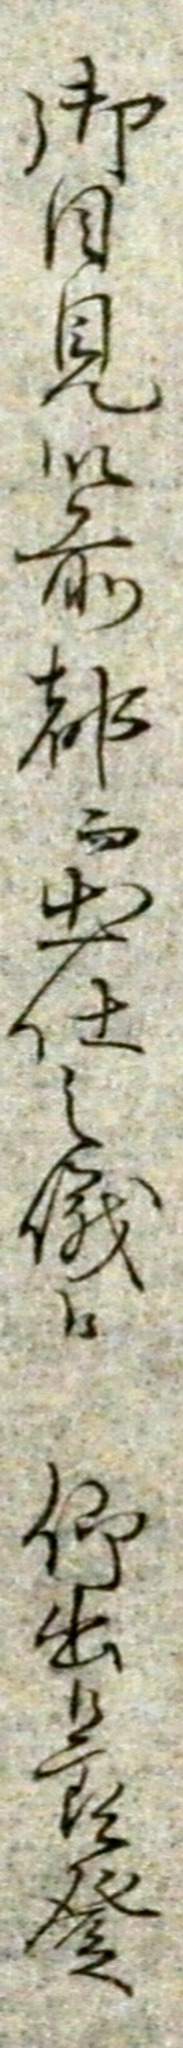御目見以前都而出仕之儀被仰出候節登
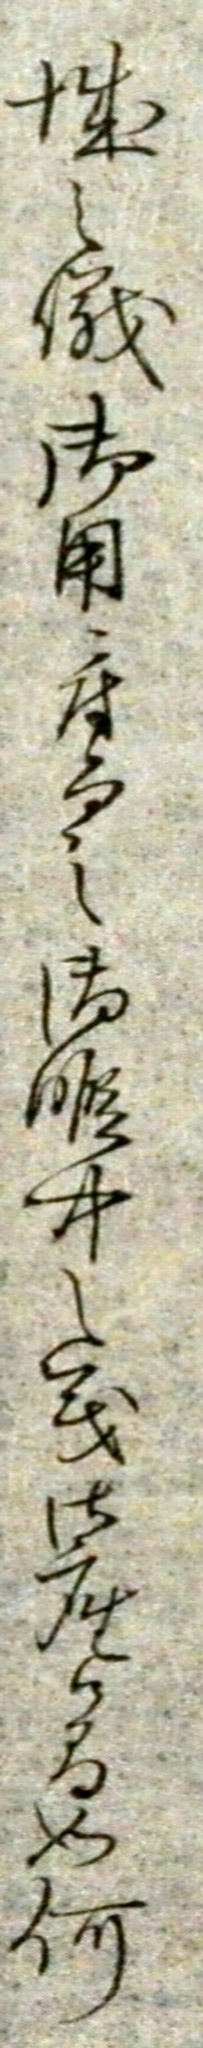城之儀御用に付て之御暇中之義御座候間如何
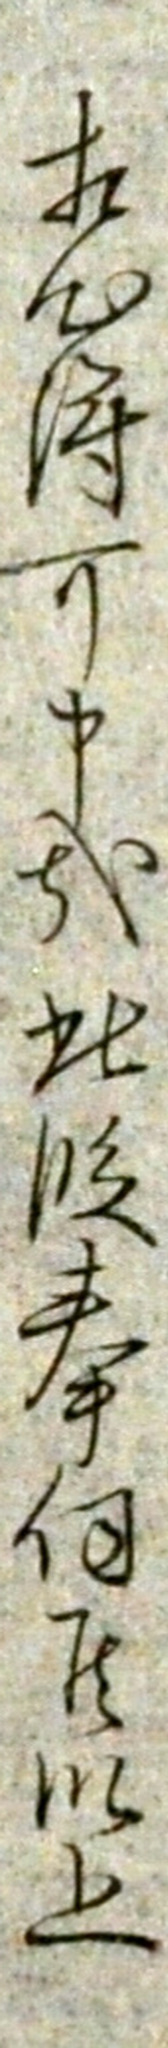相心得可申哉此段奉伺候以上

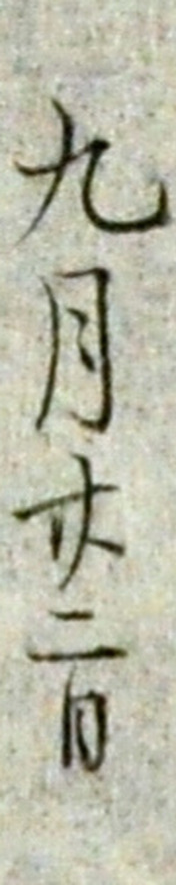九月廿二日
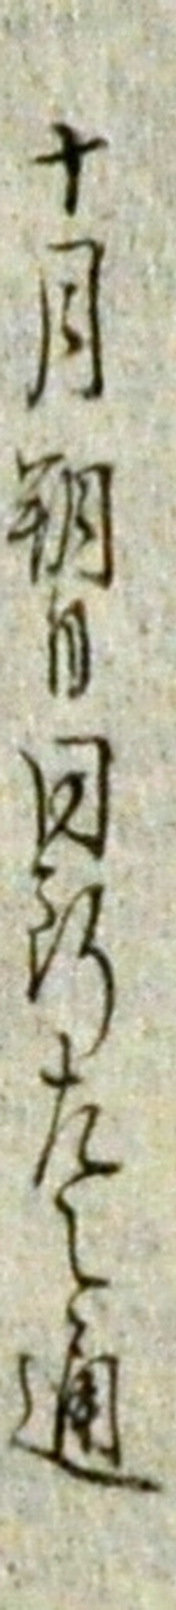十月朔日同断左之通
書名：日光御名代相勤候節ノ留
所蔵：伊那市立高遠町図書館・合同会社AMANE
